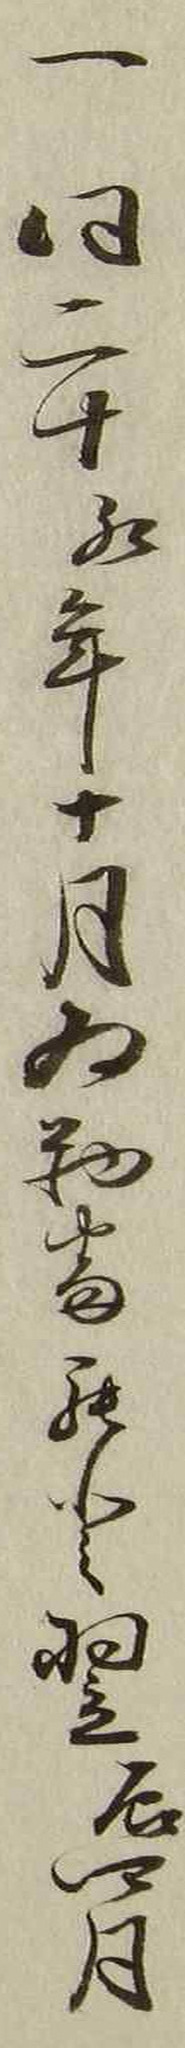一同二十卯年十月為勤番罷登翌辰四月
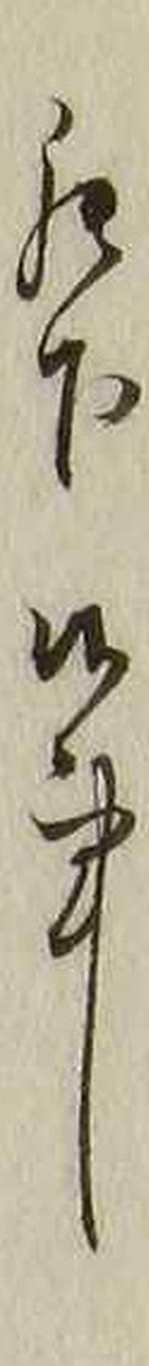罷下候事
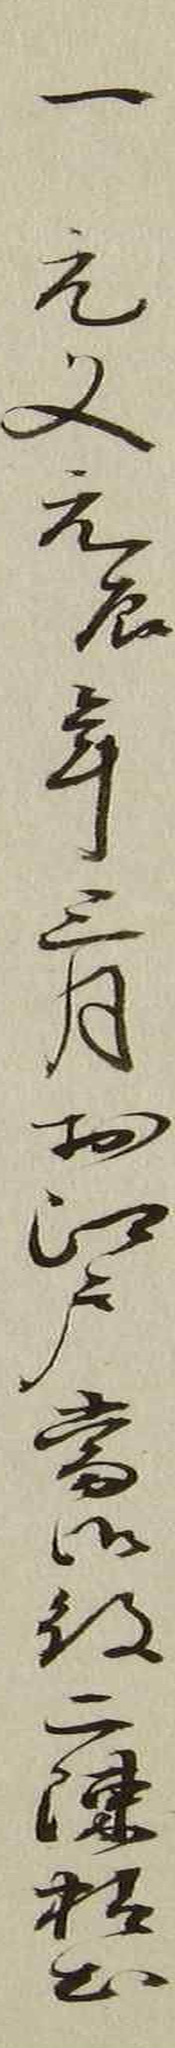一元文元辰年三月於江戸当御役二陣精出
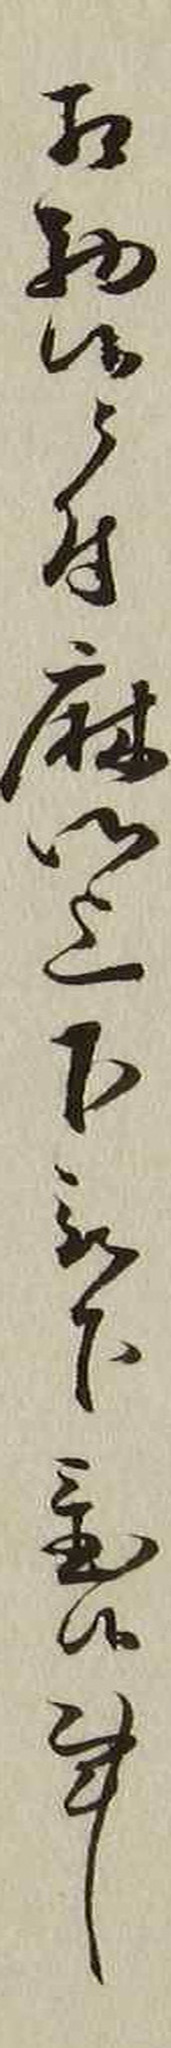相勤候ニ付麻御上下被下置候事
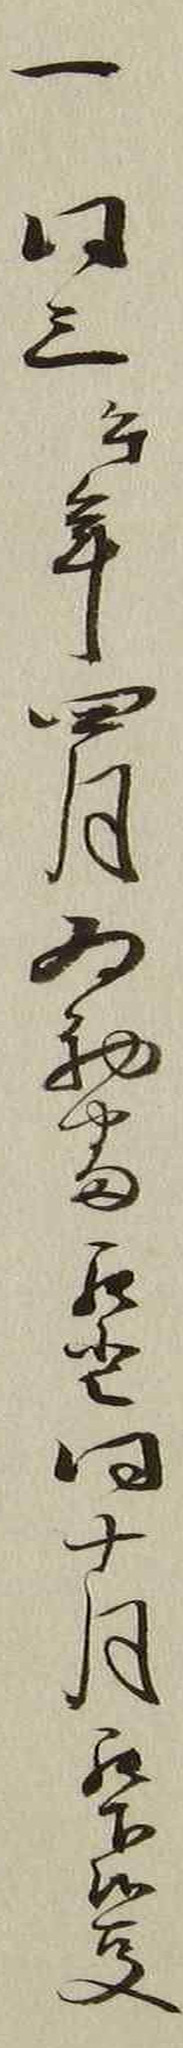一同三午年四月為勤番罷登同十月罷下候事
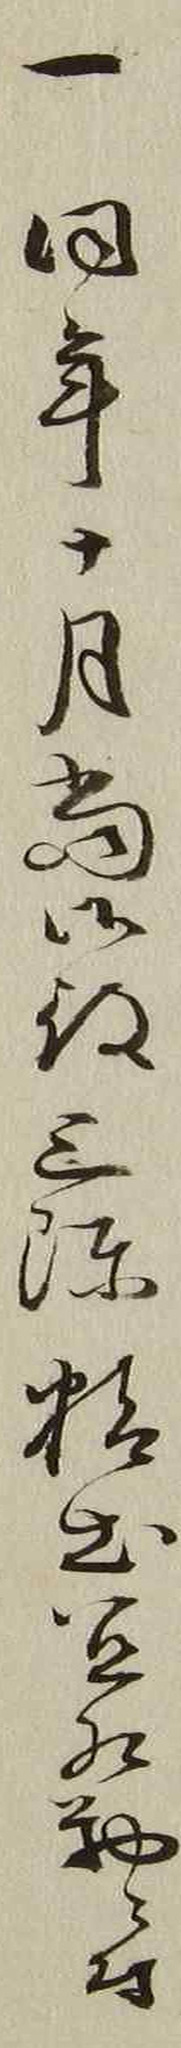一同年十月当御役三陣精出宜相勤ニ付
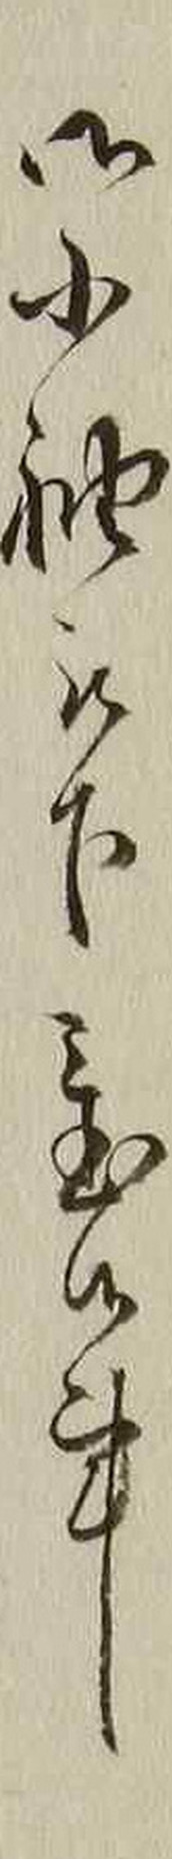御小袖被下置候事
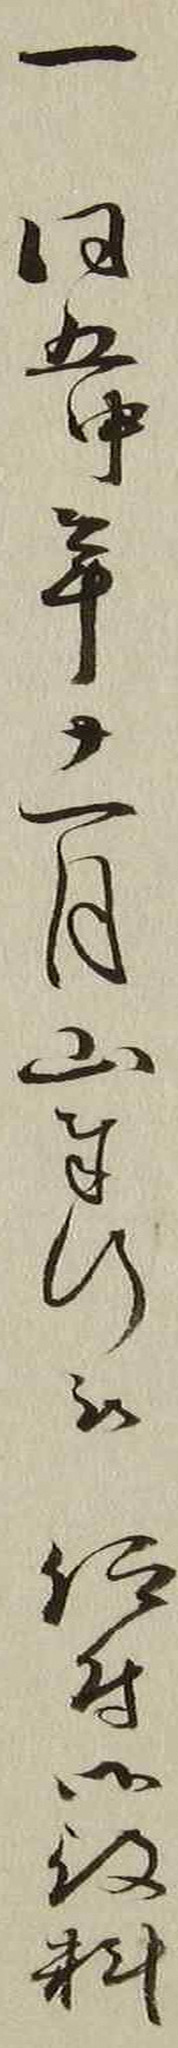一同五申年十一月山奉行被仰付御役料
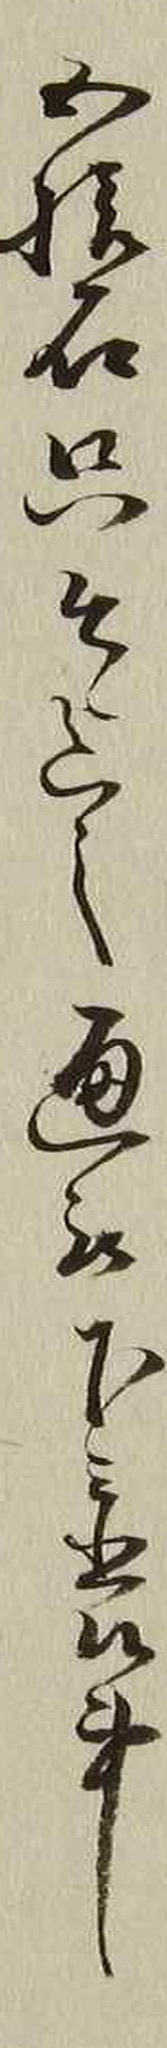五拾石只今迄之通被下置候事
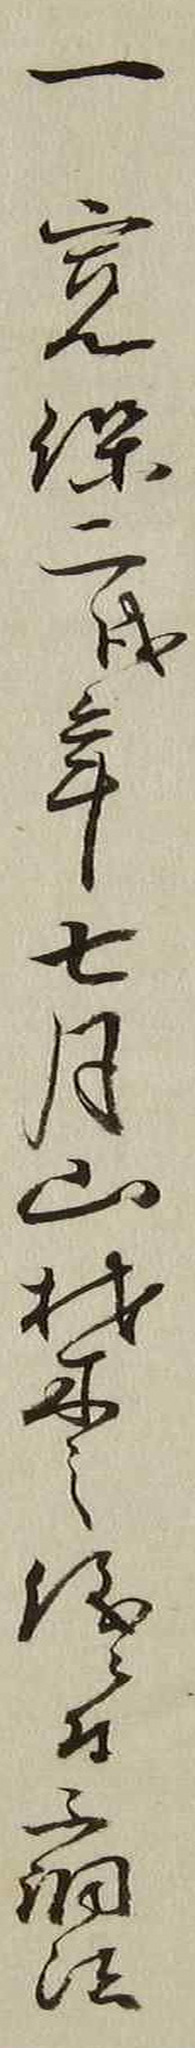一寛保二戌年七月山材木之儀ニ付不調法
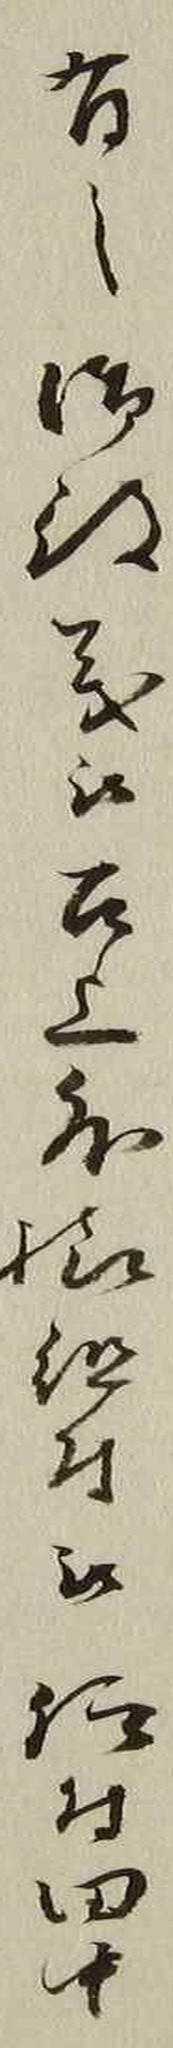有之御役義被召上外様組付被仰付田中
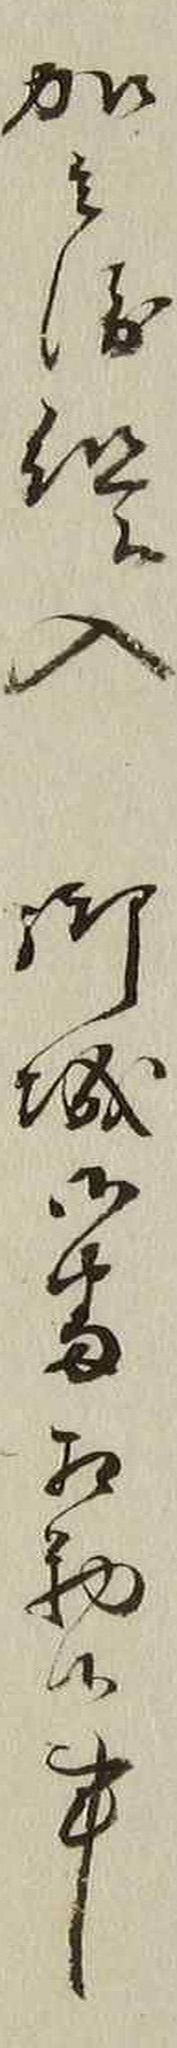加兵衛組江入御城御番相勤候事
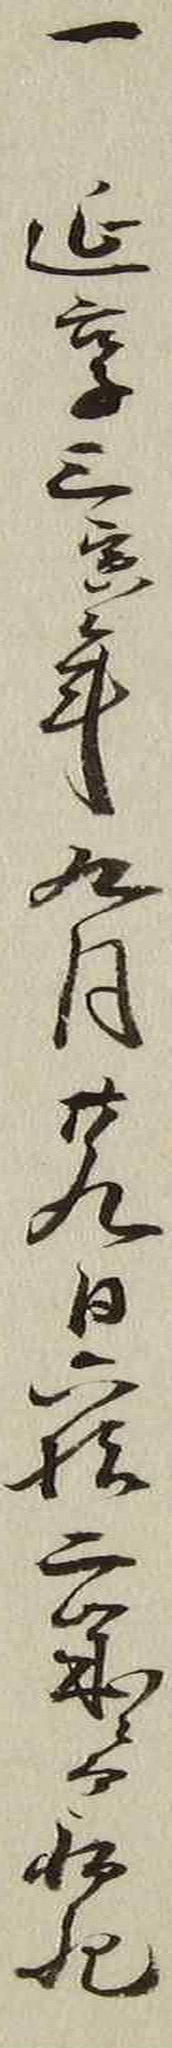一延享三寅年九月廿九日六拾二歳ニ而病死
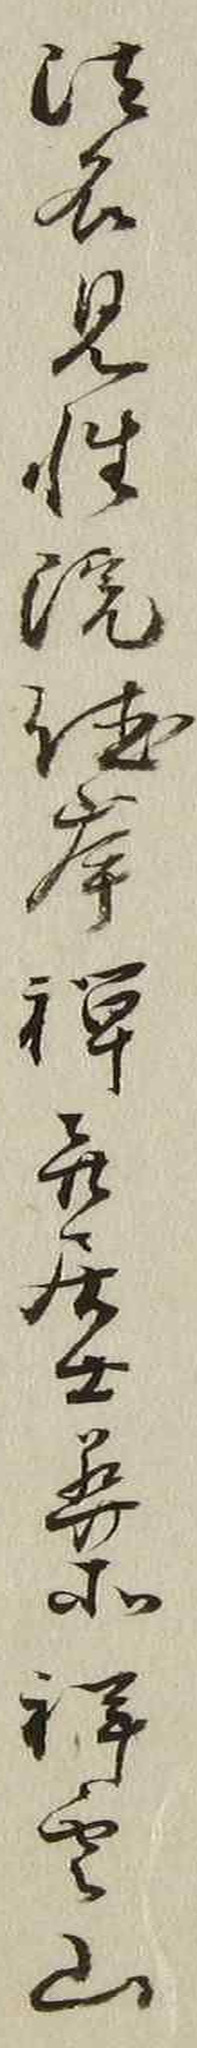法名見性院徳岸禅喜居士葬所祥雲山
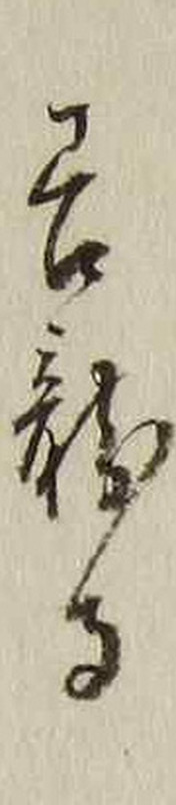善龍寺
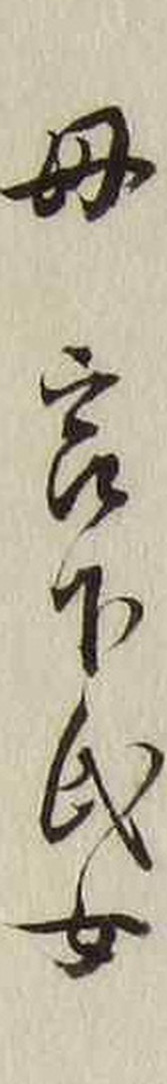母宮下氏女
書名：諸士系譜　巻之26　い之部26
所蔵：会津若松市立会津図書館
